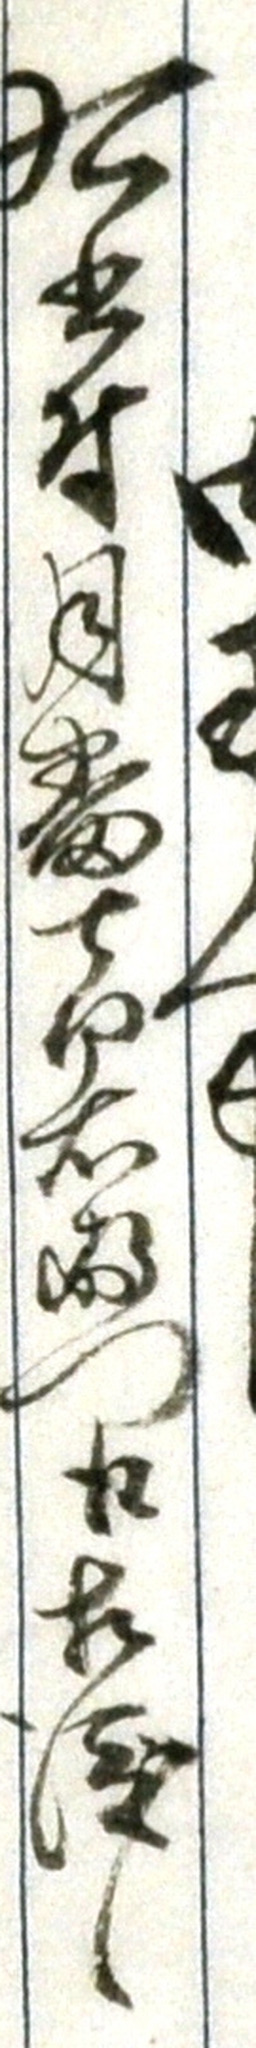右書付月番七郎右衛門江相渡候
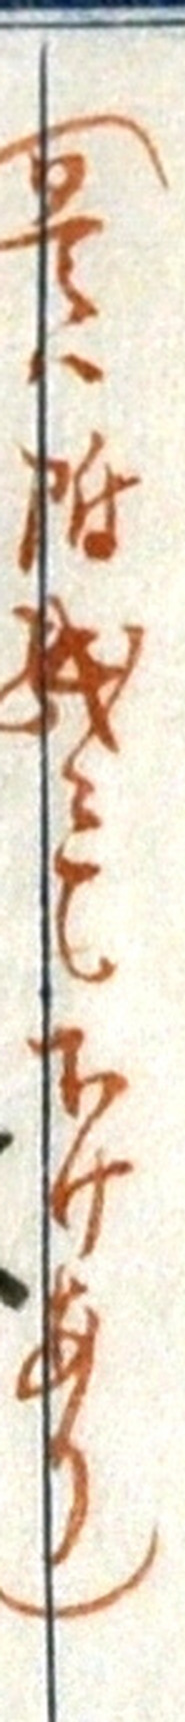是ハ附紙ニて下けあり
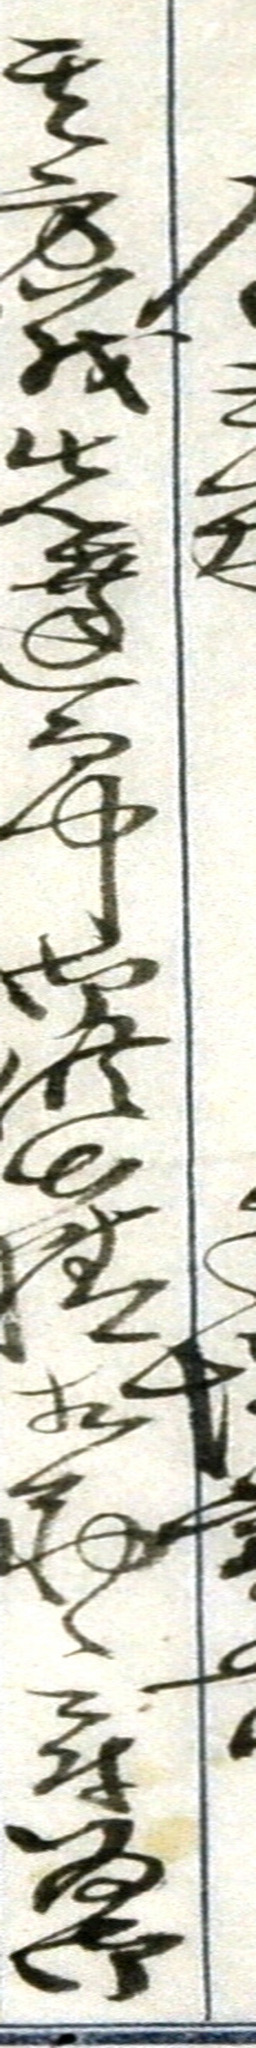其方儀先達而中御供出精相勤候ニ付為御
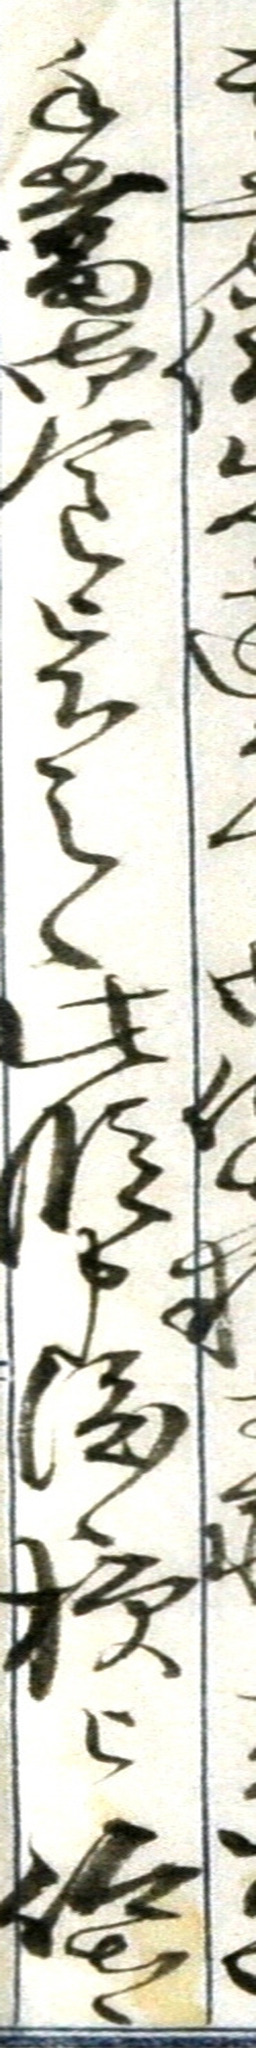手當御被下之候此段申渡候様被仰出候

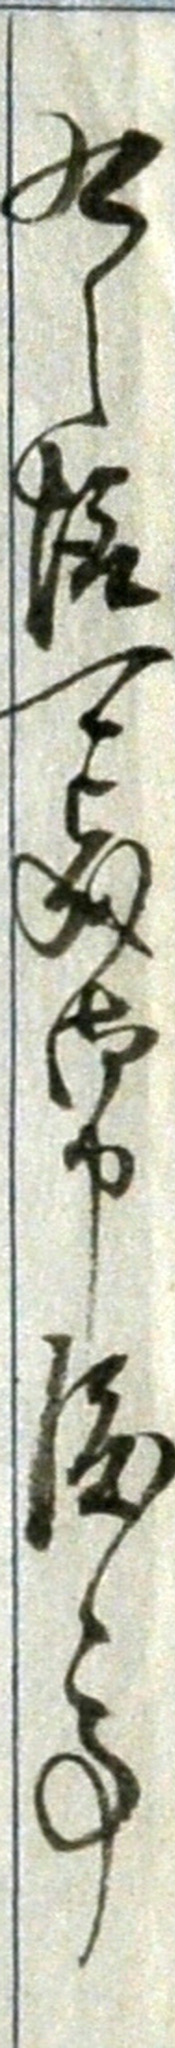右之趣可被成御申渡候事
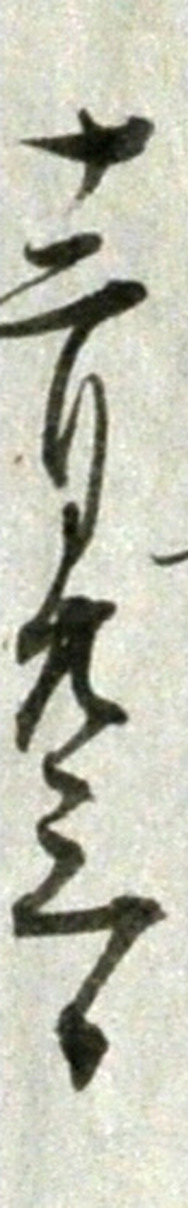十二月廿三日
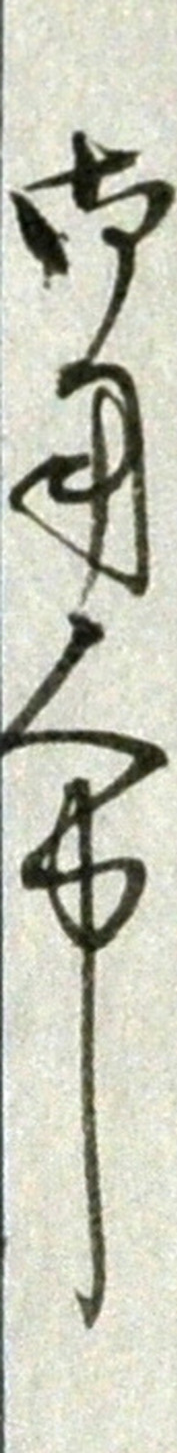御用人中
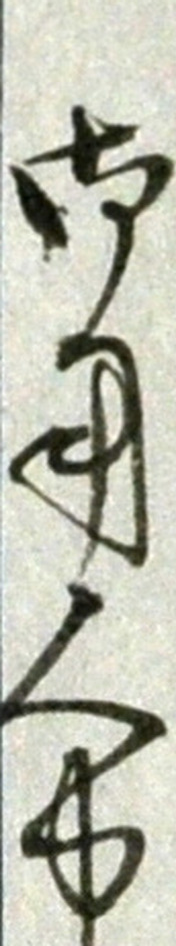御用人中
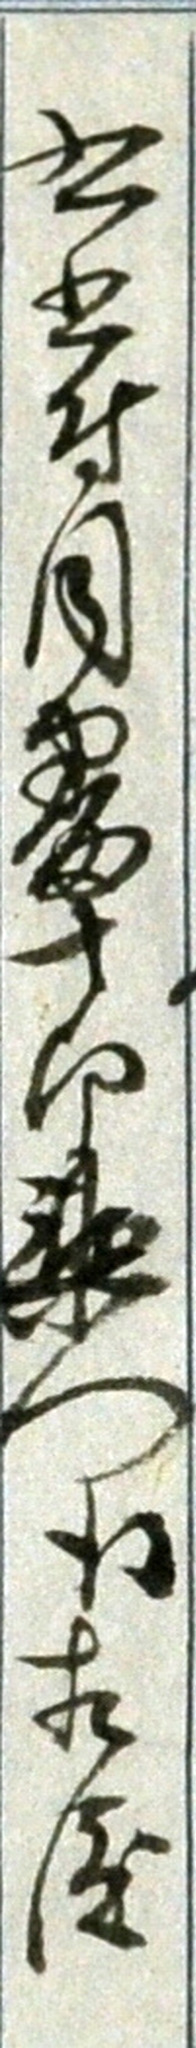右書付月番七郎右衛門江相渡
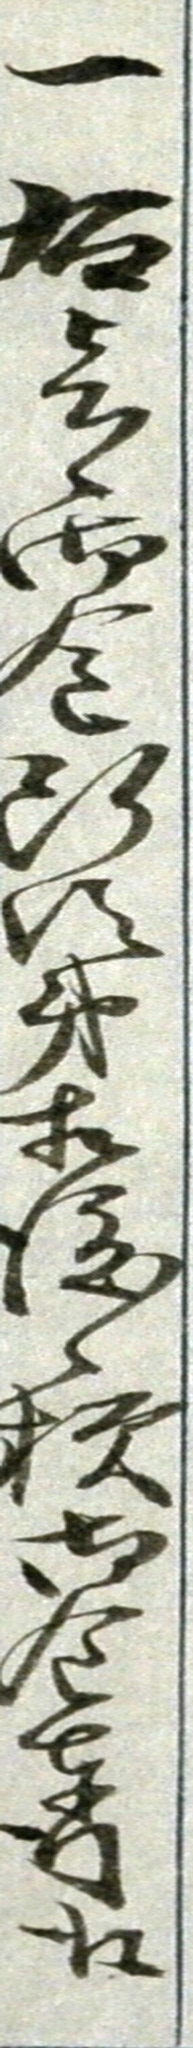一右被下候御金断次第相渡候様御金奉行江
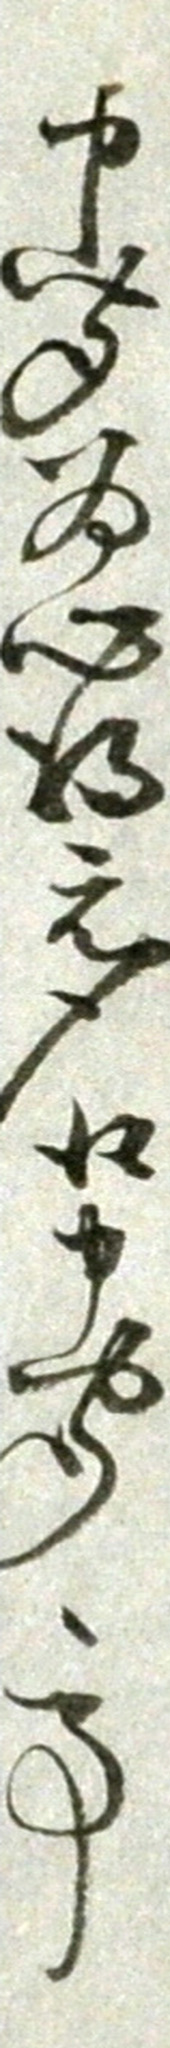申聞為心得元〆江申聞候事
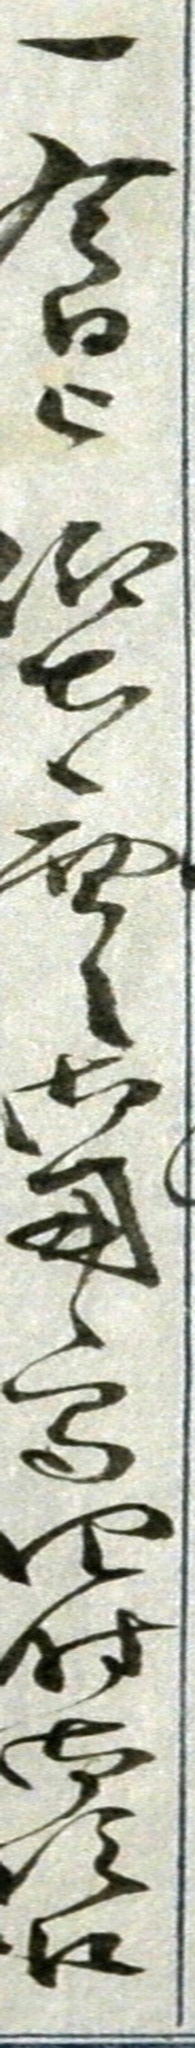一今日被仰出候面々御用之間四時御次江
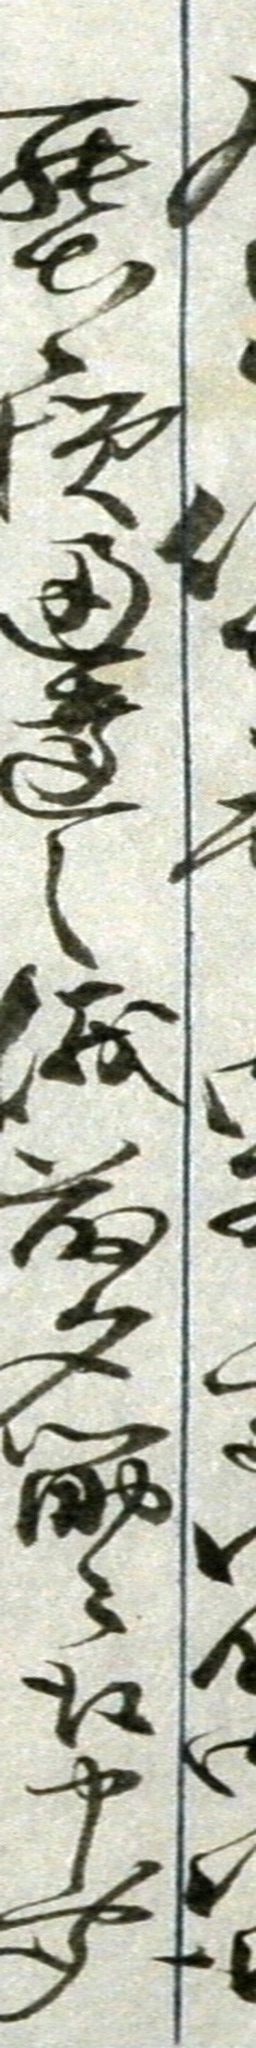罷出候様通達之儀前夕筋々江申聞
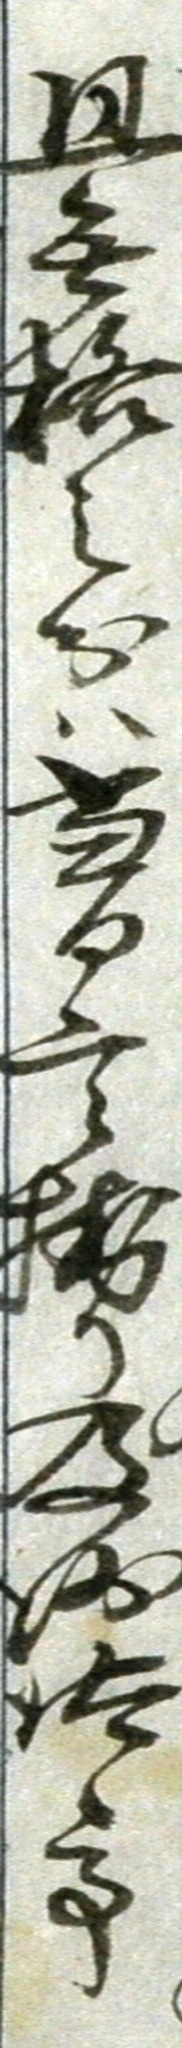且無格之分ㇵ当日其掛り及沙汰候事
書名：上方ヨリ御帰府之後江戸勤并江戸在番中之者江被下・控
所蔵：伊那市立高遠町図書館・合同会社AMANE
